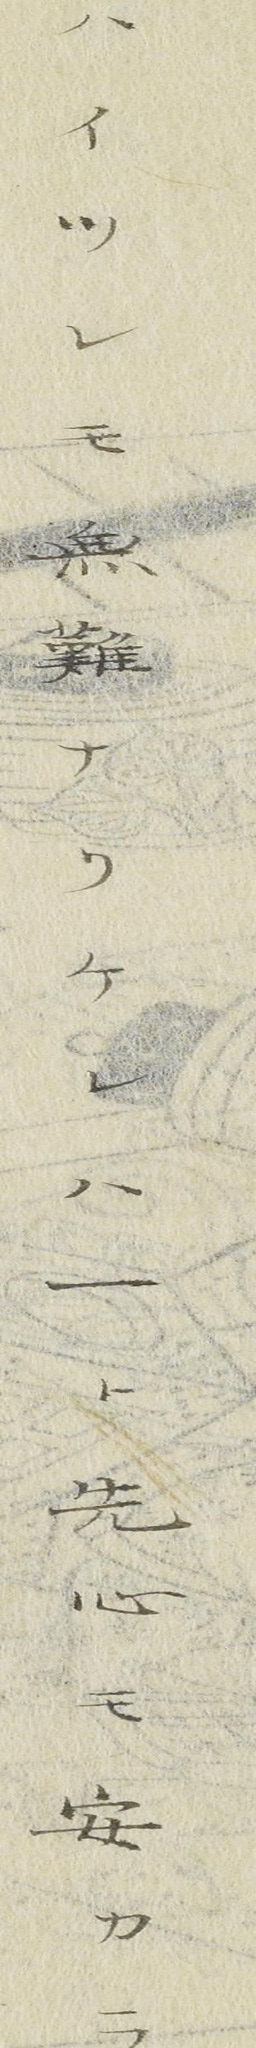ハイツレモ無難ナリケレハ一ト先心モ安カラ
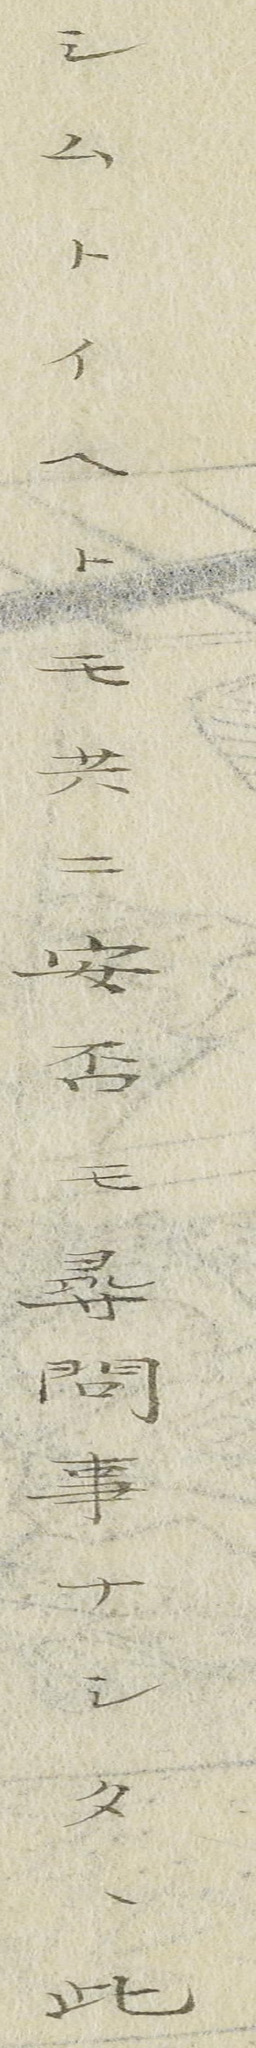シムトイヘトモ共ニ安否モ尋問事ナシタヽ此
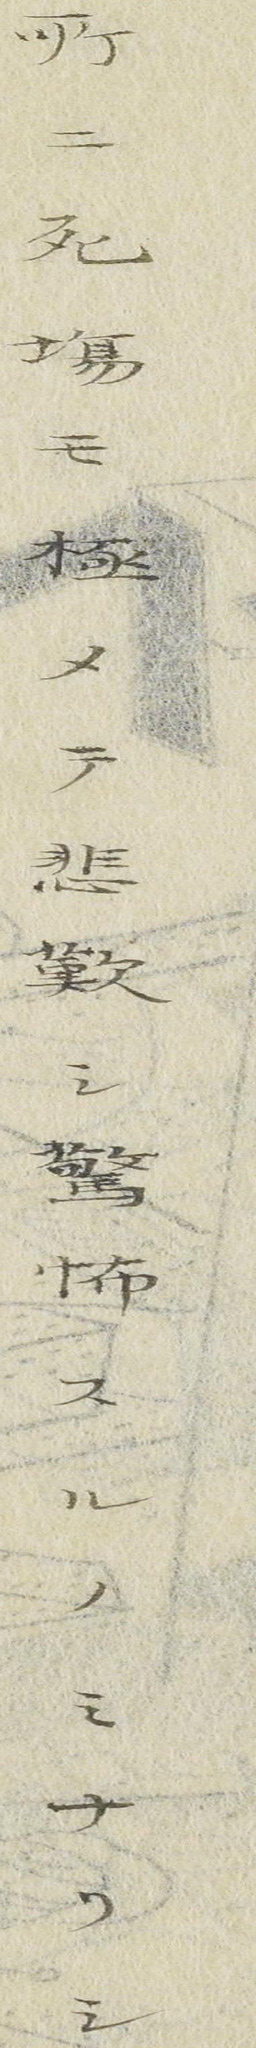所ニ死傷モ極メテ悲歎シ驚怖スルノミナリシ
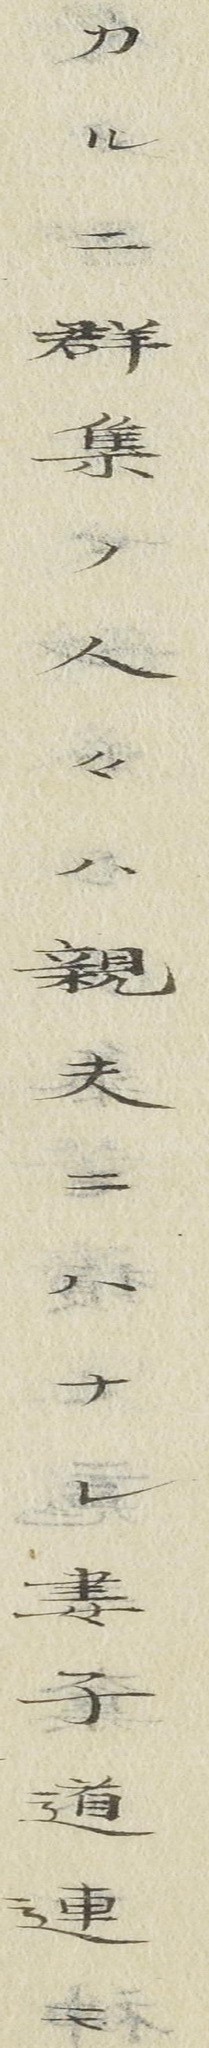カルニ群集ノ人々ハ親夫ニハナレ妻子道連モ
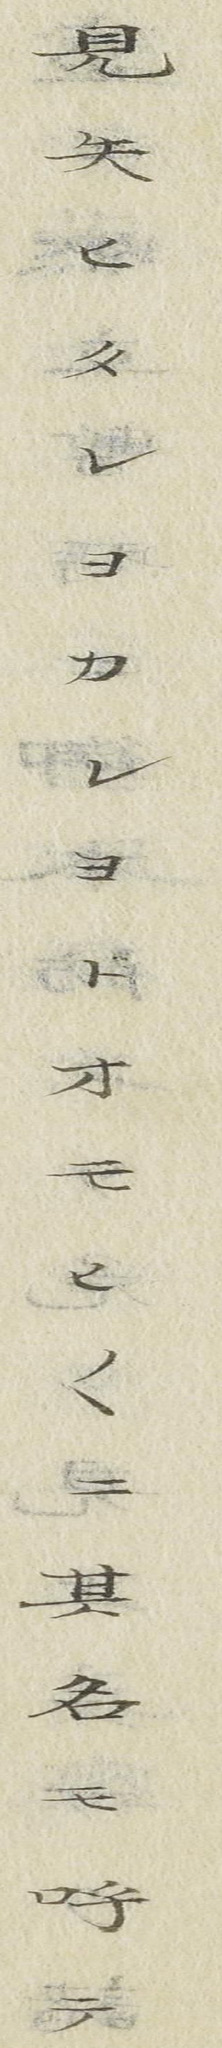見失ヒタレヨカレヨトオモヒ〱ニ其名ヲ呼テ
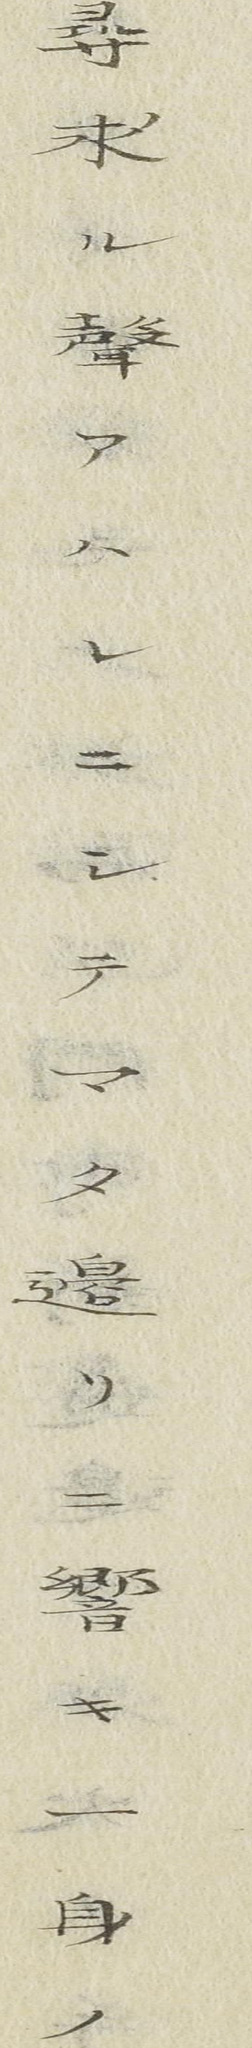尋求ル声アハレニシテマタ辺リニ響キ一身ノ
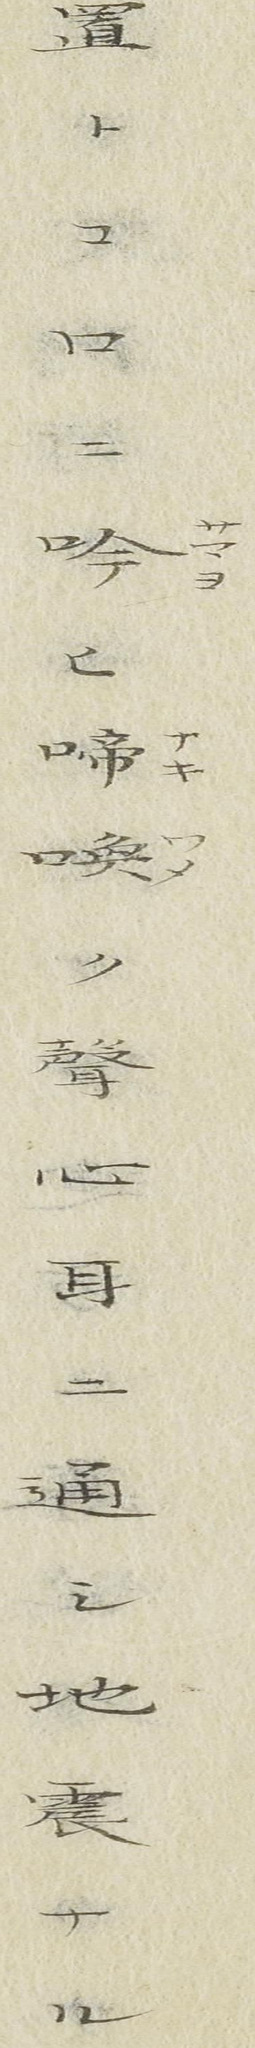置トコロニ吟ヒ啼喚ク声心耳ニ通シ地震ナル
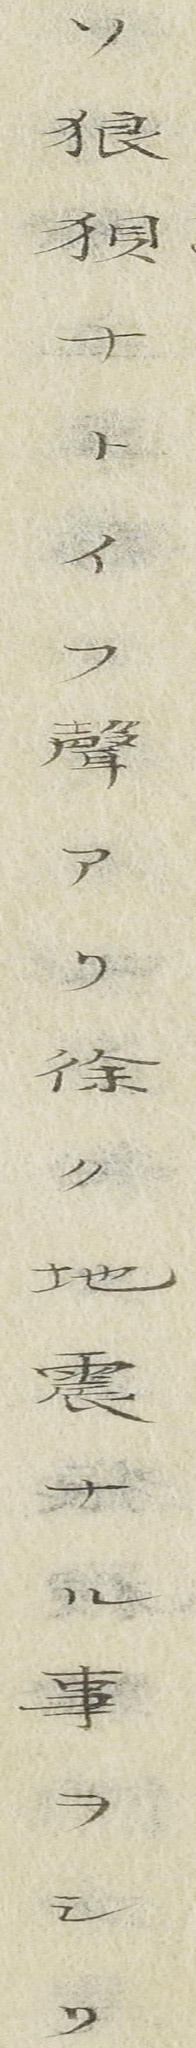ソ狼狽ナトイフ声アリ徐ク地震ナル事ヲシリ
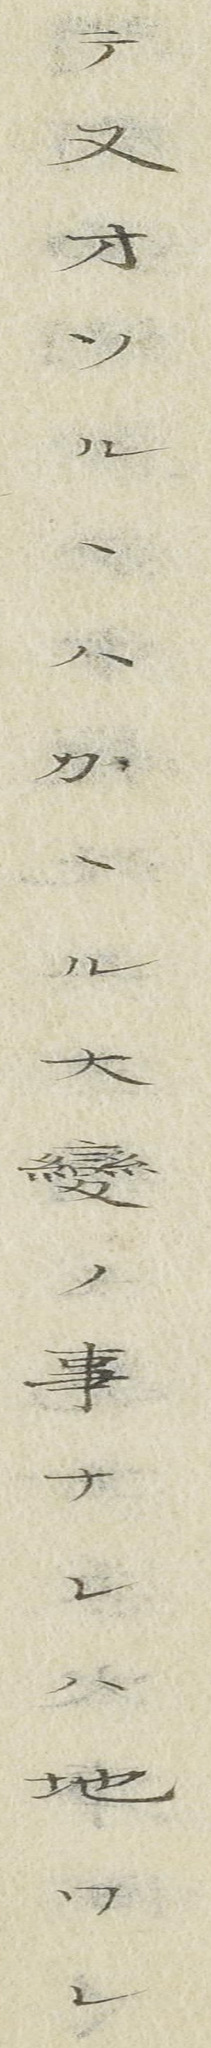テ又オソルヽハカヽル大変ノ事ナレハ地ワレ
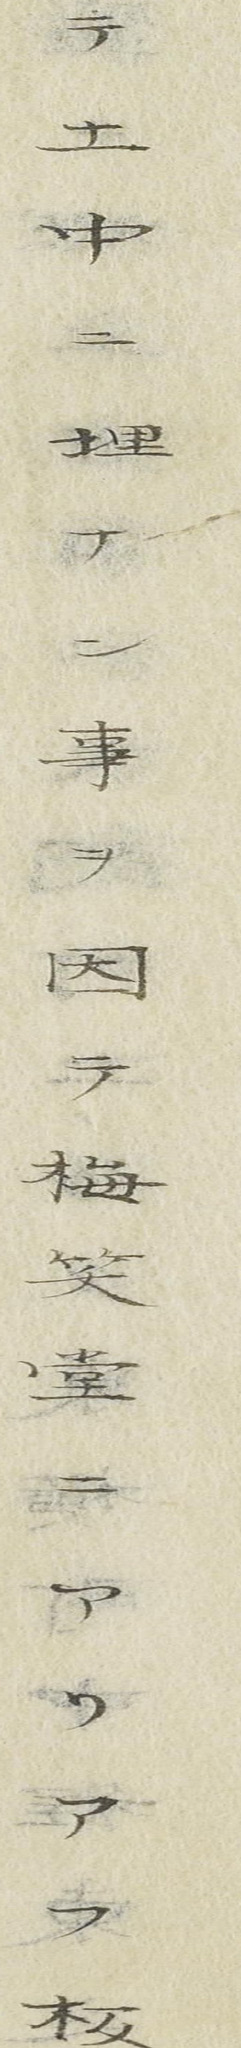テ土中ニ埋ナン事ヲ因テ梅笑堂ニアリアフ板
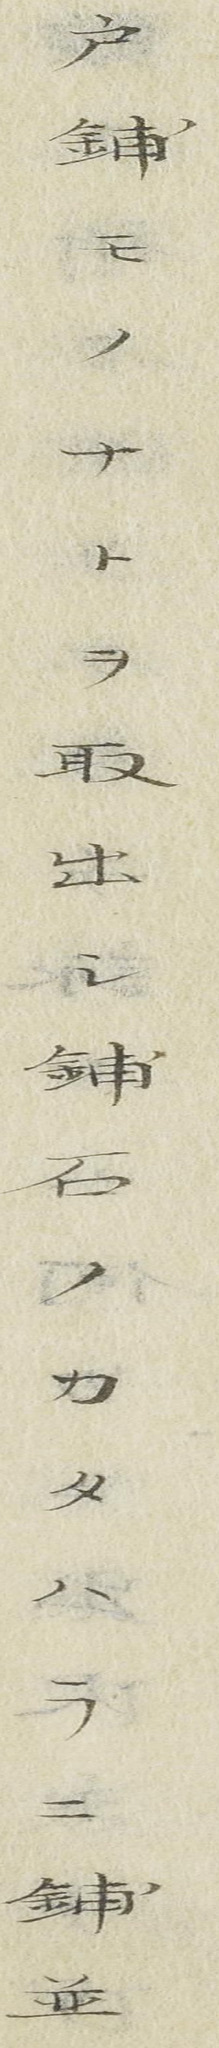戸敷モノナトヲ取出シ鋪石ノカタハラニ鋪並
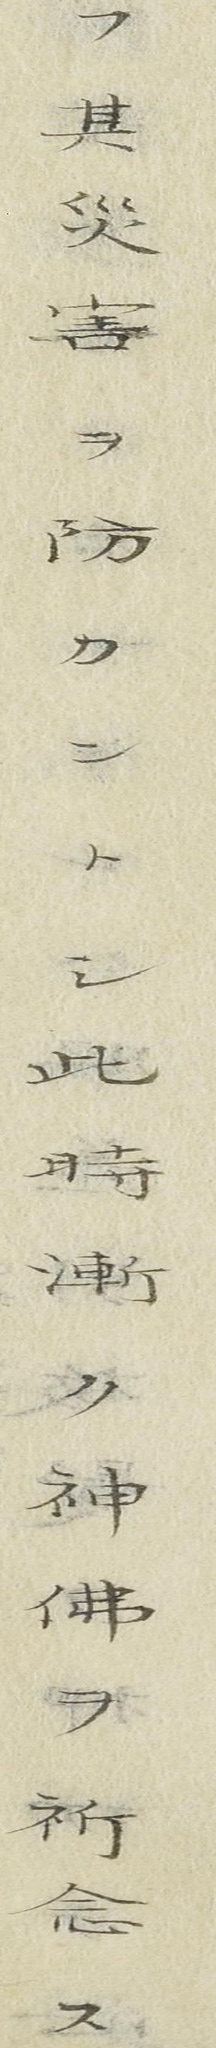フ其災害ヲ防カントシ此時漸ク神仏ヲ祈念ス
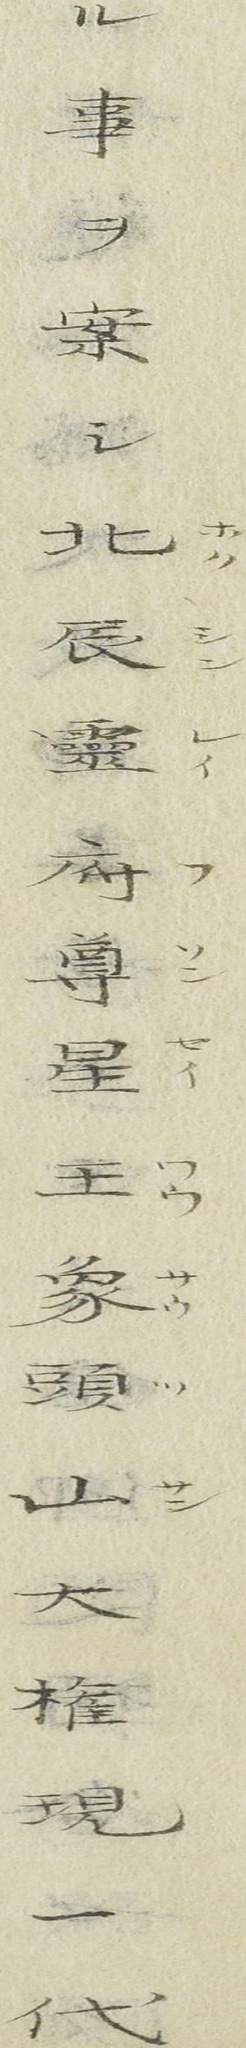ル事ヲ案シ北辰霊府尊星王象頭山大権現一代

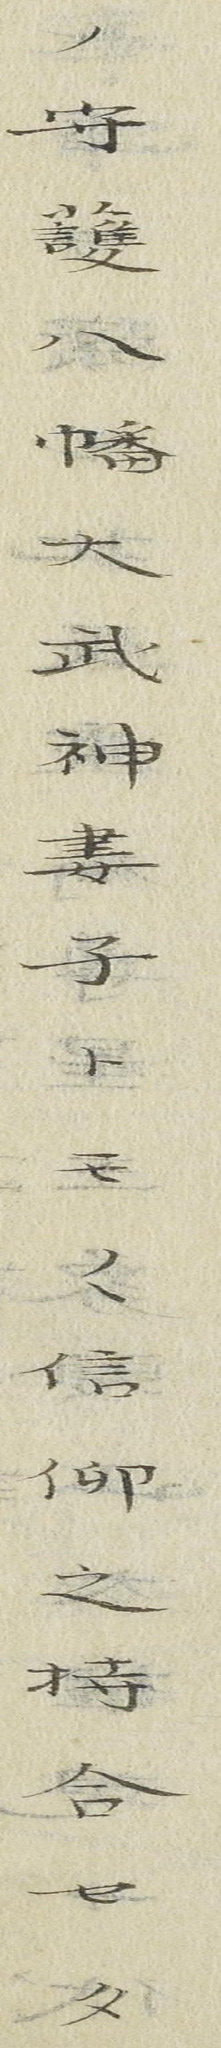ノ守護八幡大武神妻子トモ〱信仰之持合セタ
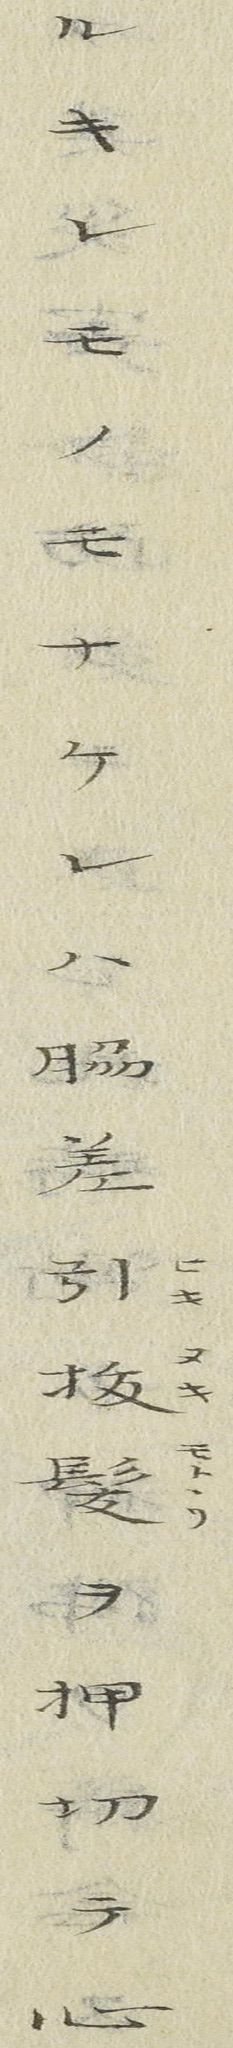ルキレモノモナケレハ脇差引抜髪ヲ押切テ心
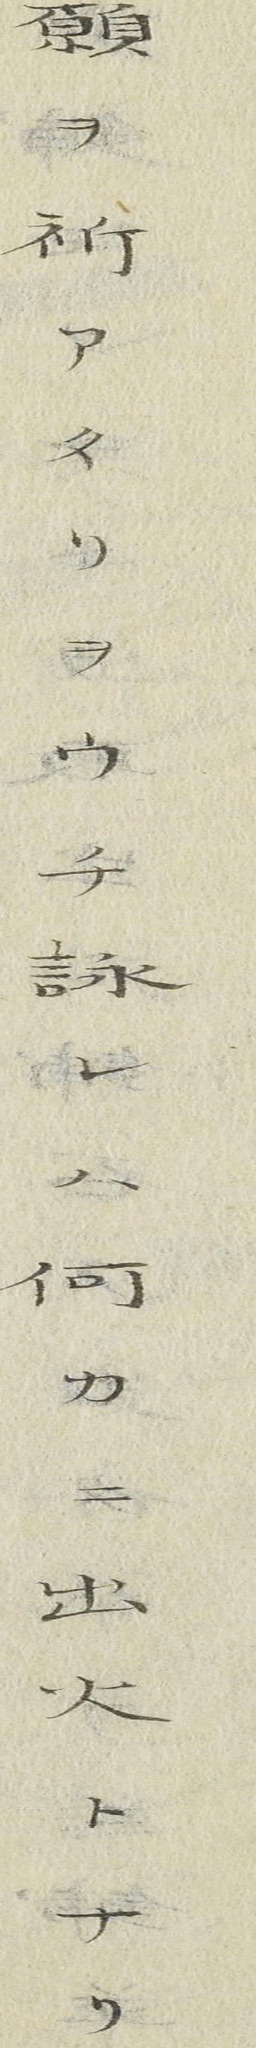願ヲ祈アタリヲウチ詠レハ何カニ出火トナリ
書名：地災撮要　地震之部　巻ノ二
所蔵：東京大学地震研究所図書室 Earthquake Research Institute Library, The University of Tokyo, JAPAN
